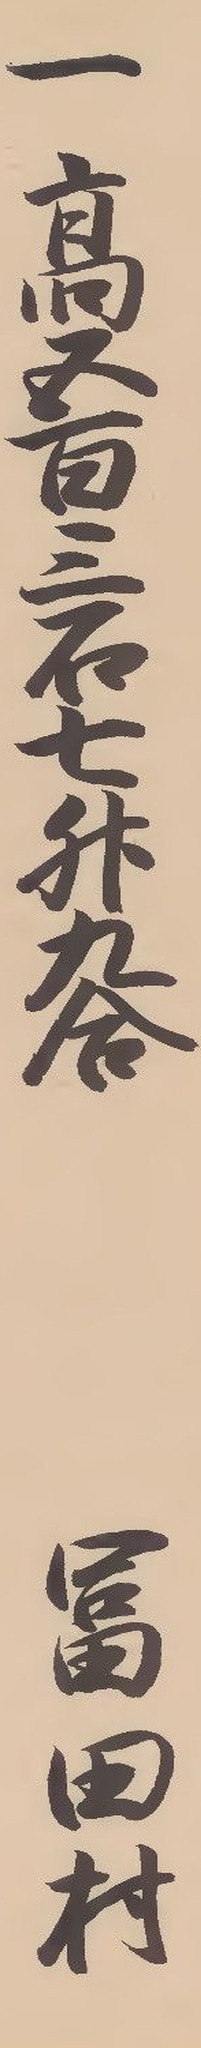一高五百三石七升九合富田村
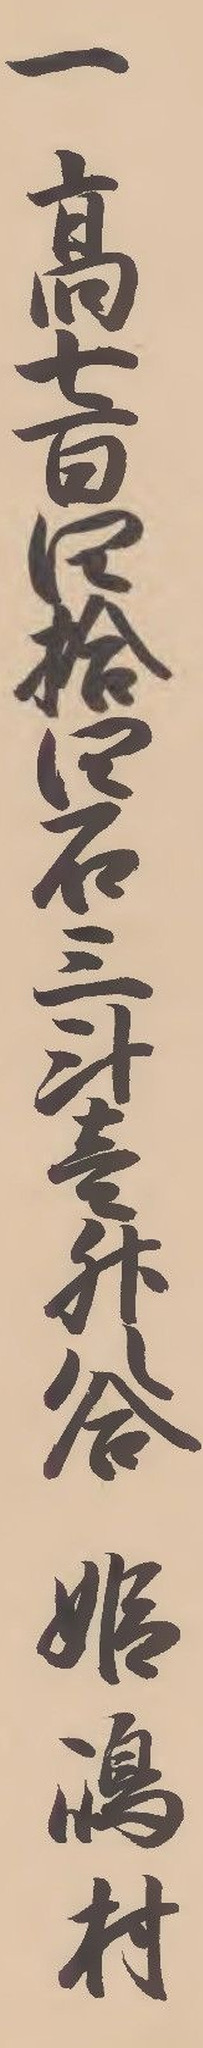一高七百四拾四石三斗壱升八合姫島村

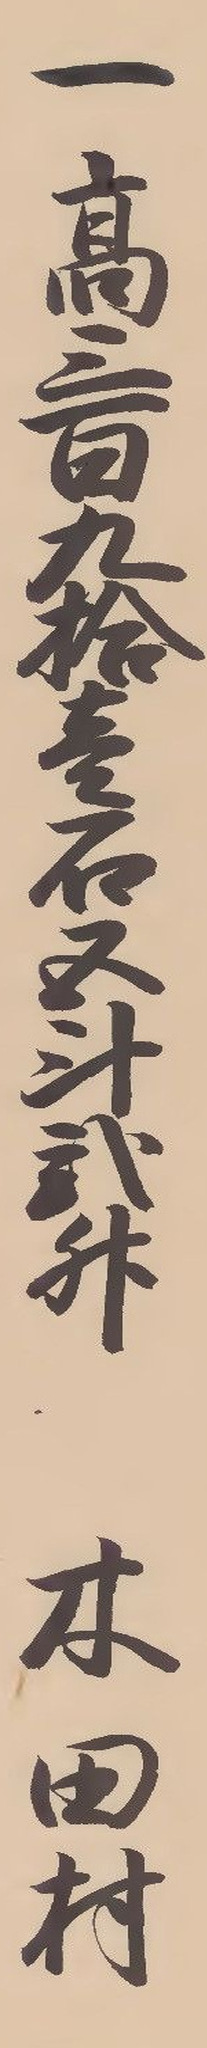一高三百九拾壱石五斗弐升木田村
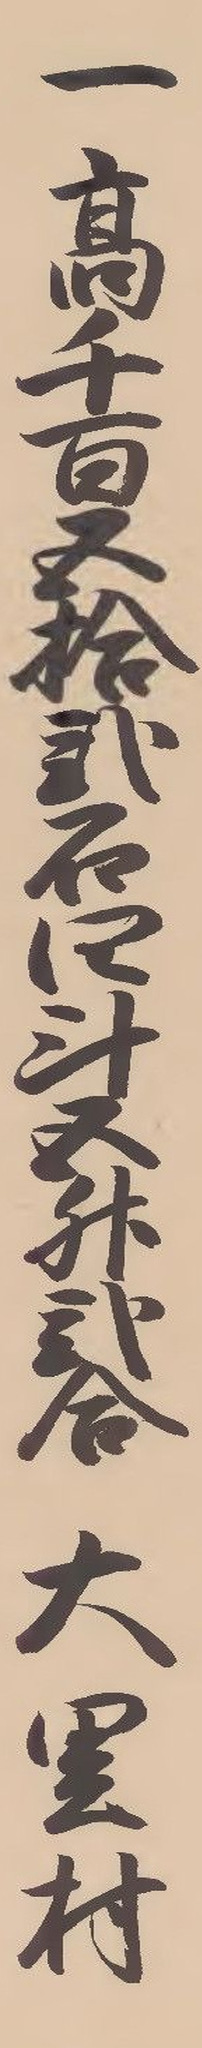一高千百五拾弐石四斗五升弐合大里村
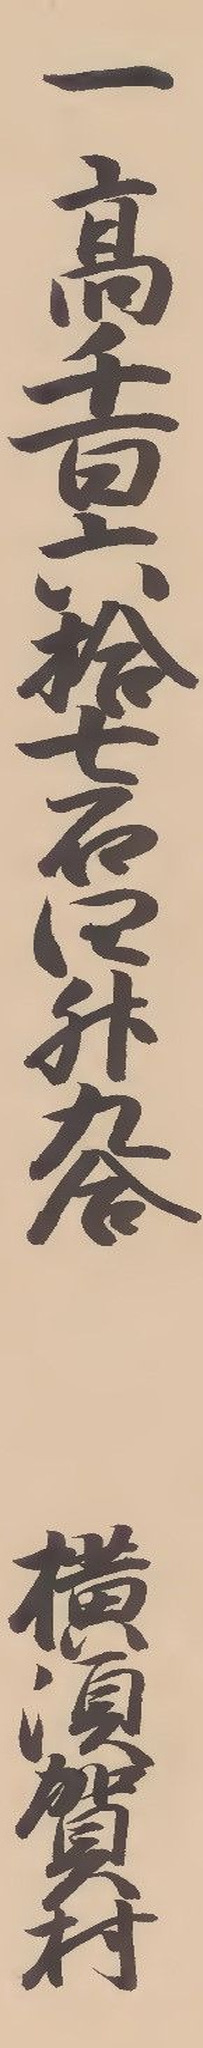一高千百六拾七石四升九合横須賀村
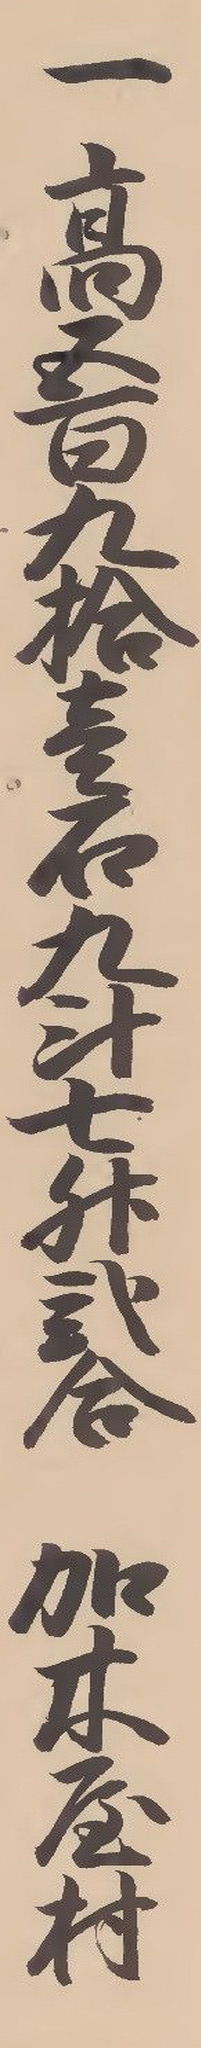一高五百九拾壱石九斗七升弐合加木屋村
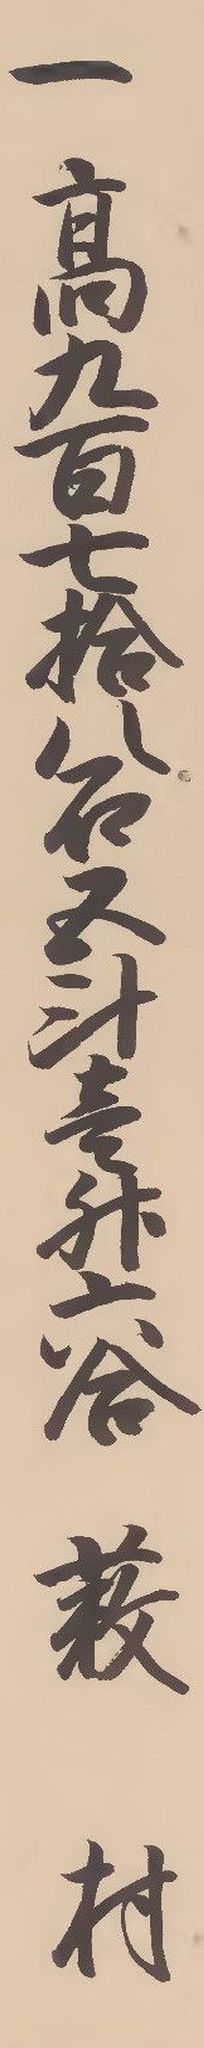一高九百七拾八石五斗壱升六合薮村
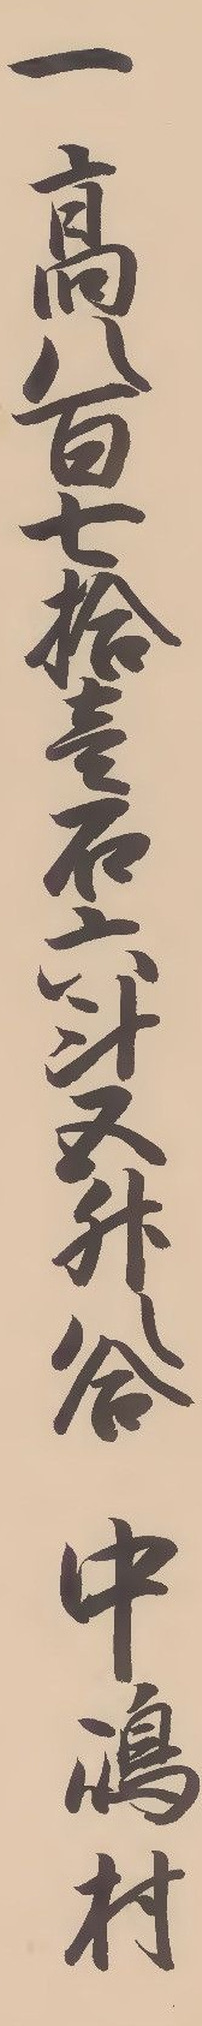一高八百七拾壱石六斗五升八合中島村
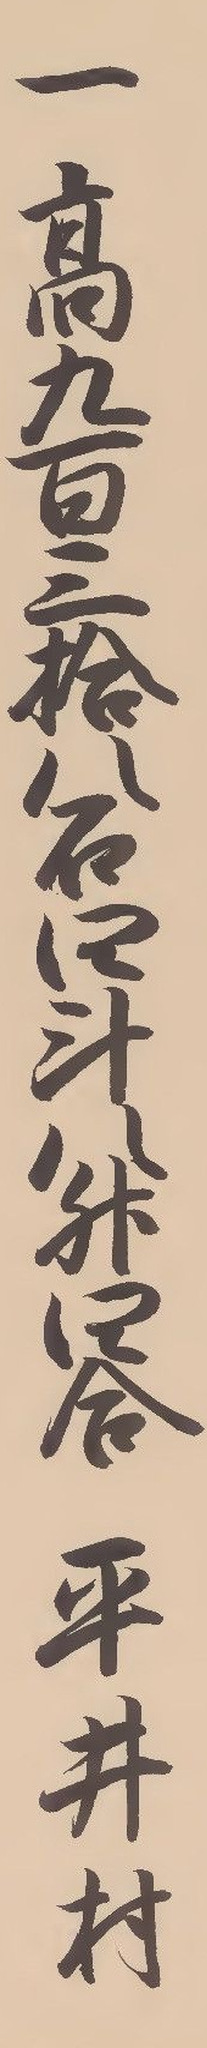一高九百三拾八石四斗八升四合平井村
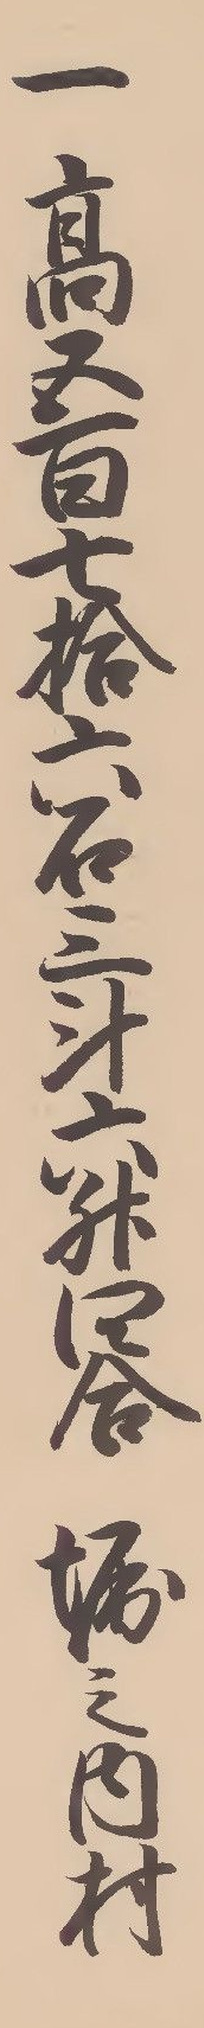一高五百七拾六石三斗六升四合堀之内村

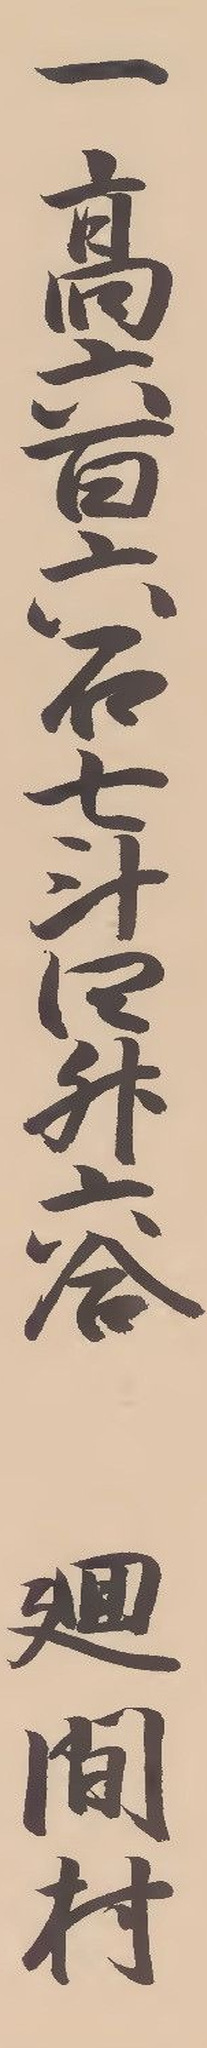一高六百六石七斗四升六合廻間村
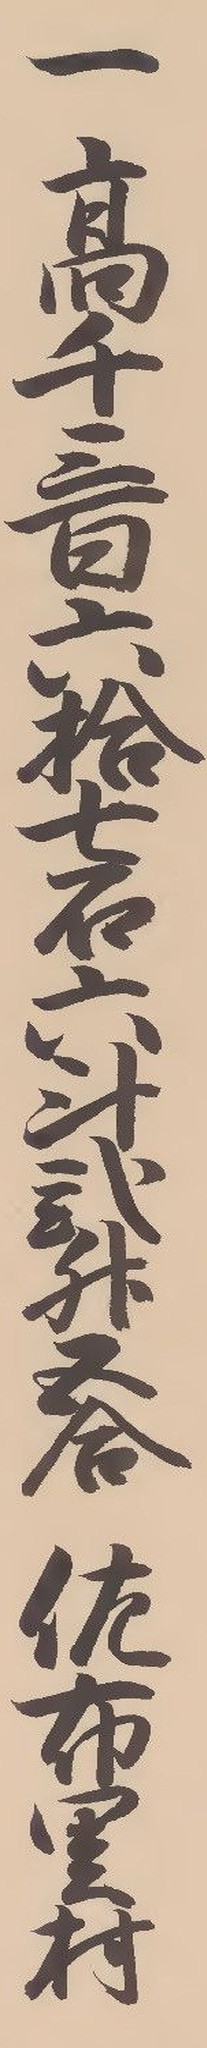一高千三百六拾七石六斗弐升五合佐布里村
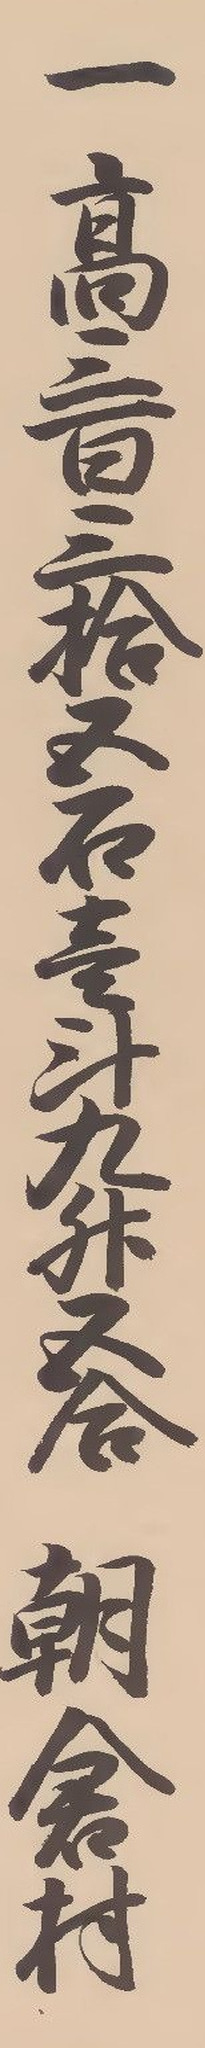一高三百三拾五石壱斗九升五合朝倉村
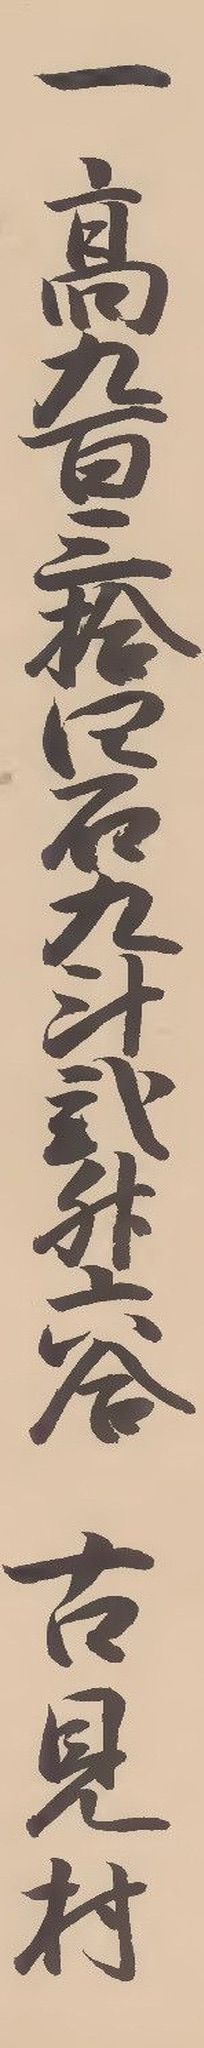一高九百三拾四石九斗弐升六合古見村
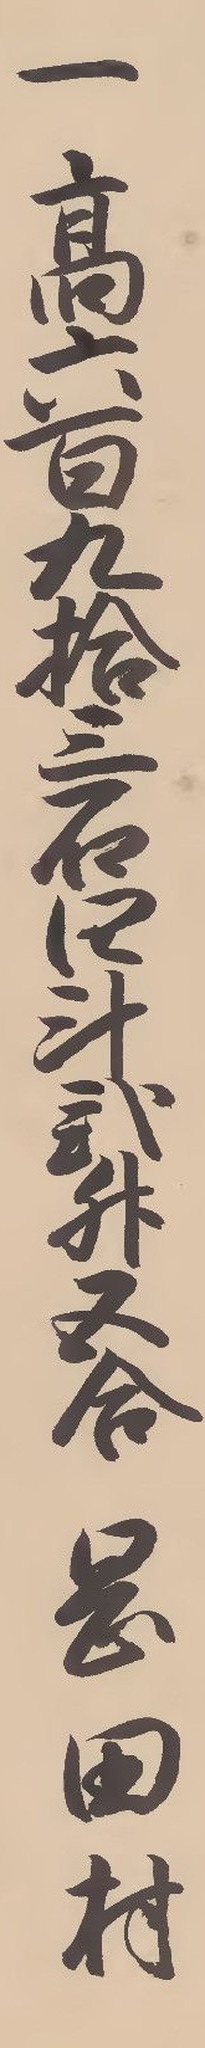一高六百九拾三石四斗弐升五合岡田村
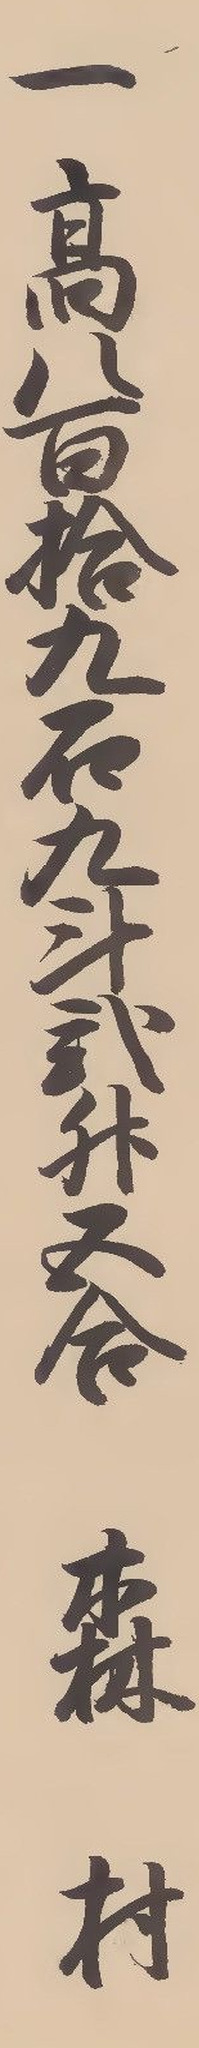一高八百拾九石九斗弐升五合森村
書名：尾張国郷帳
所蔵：国立公文書館 National Archives of Japan
